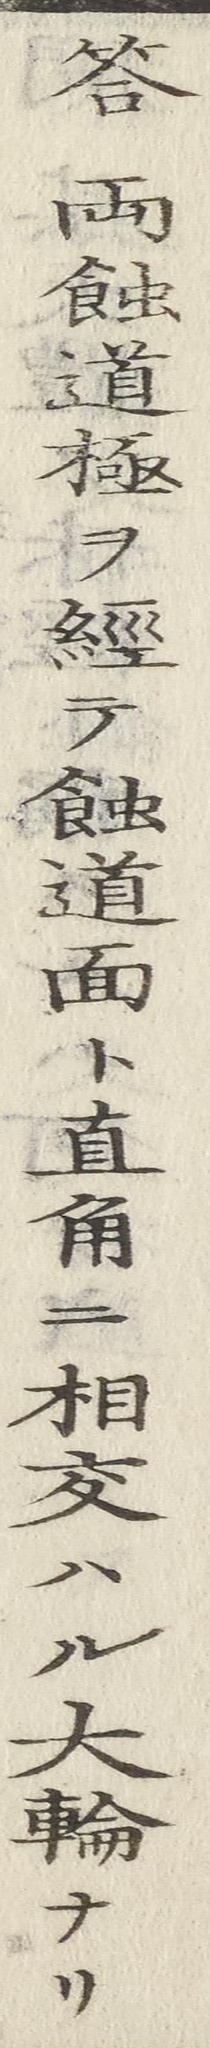答両蝕道極ヲ経テ蝕道面ト直角ニ相交ハル大輪ナリ
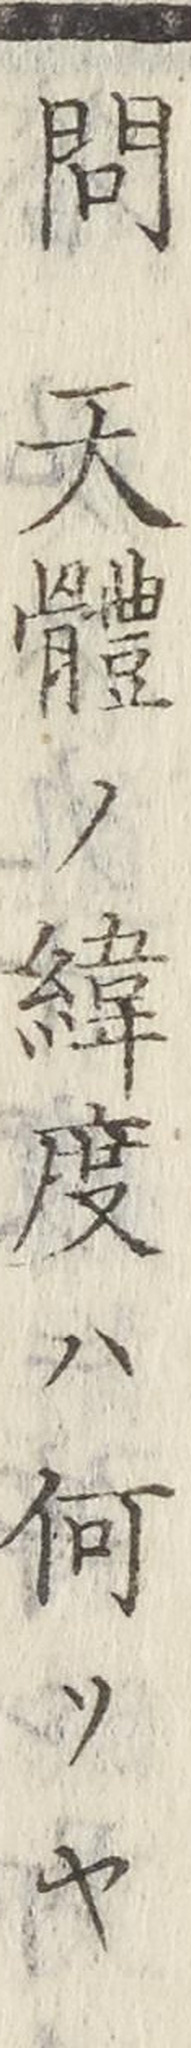問天体ノ緯度ハ何ソヤ
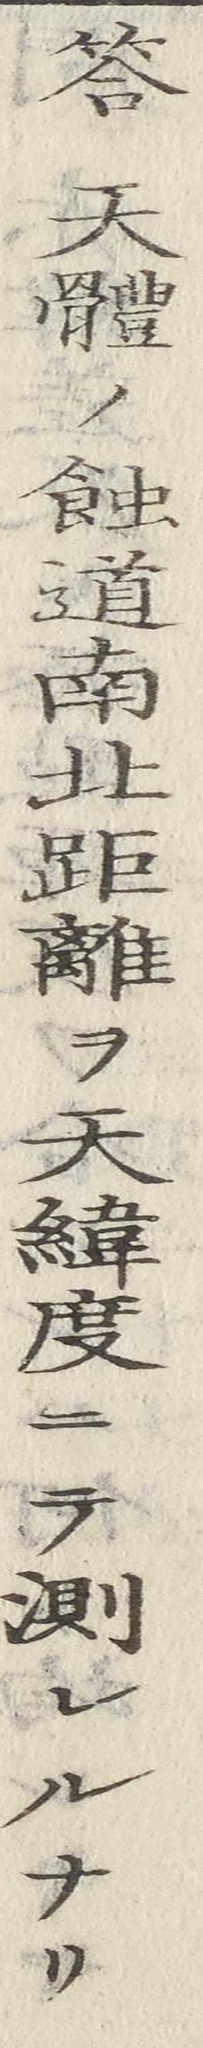答天体ノ蝕道南北距離ヲ天緯度ニテ測レルナリ
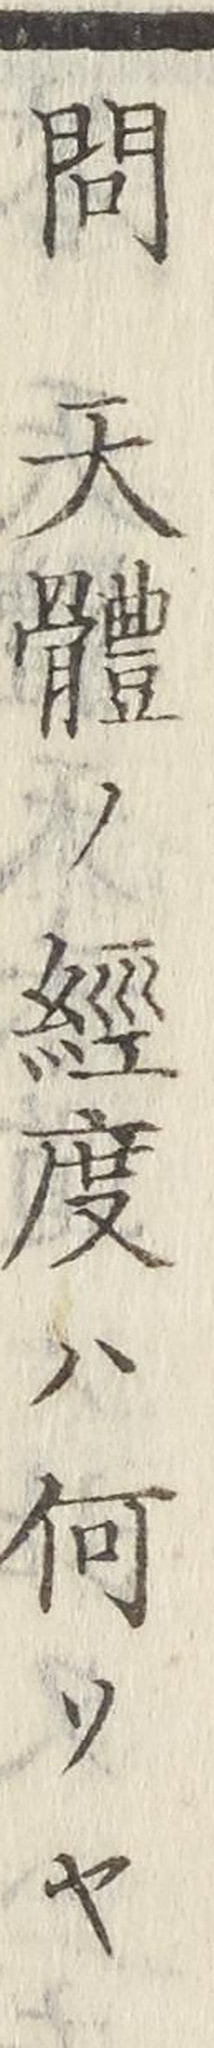問天体ノ経度ハ何ソヤ
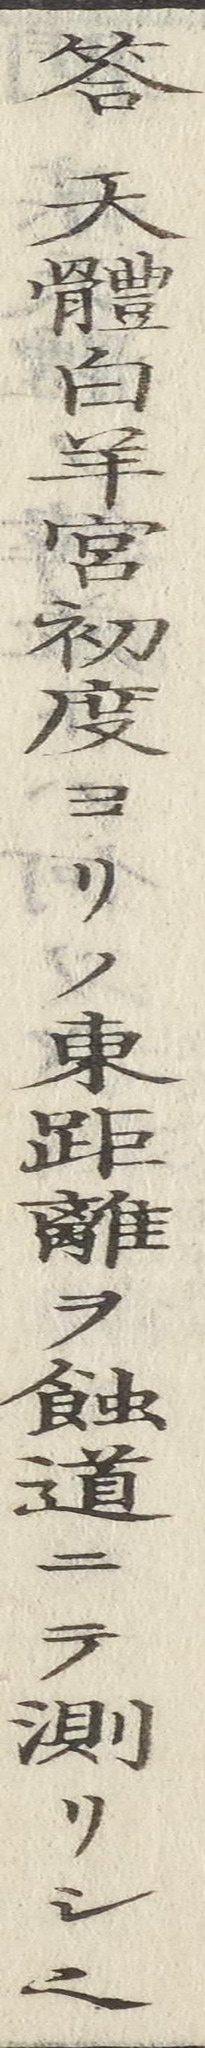答天体白羊宮初度ヨリノ東距離ヲ蝕道ニテ測リシ也
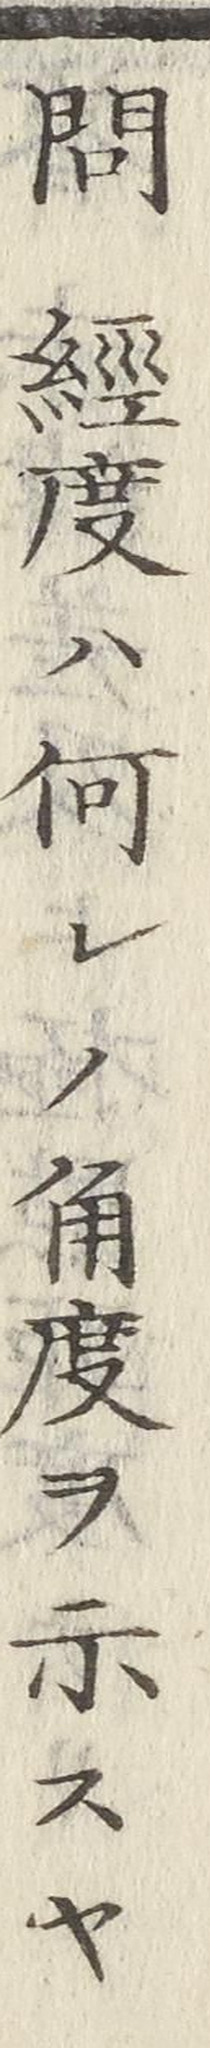問経度ハ何レノ角度ヲ示スヤ
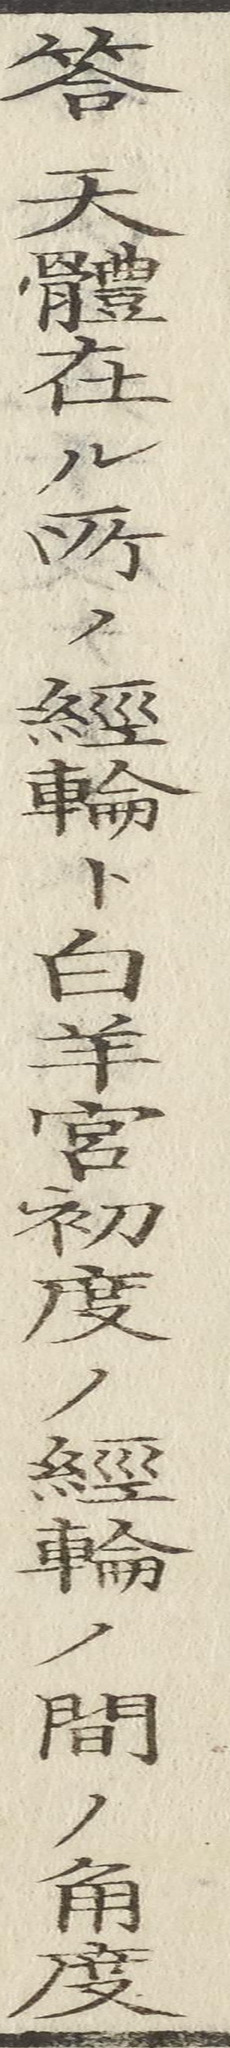答天体在ル所ノ経輪ト白羊宮初度ノ経輪ノ間ノ角度
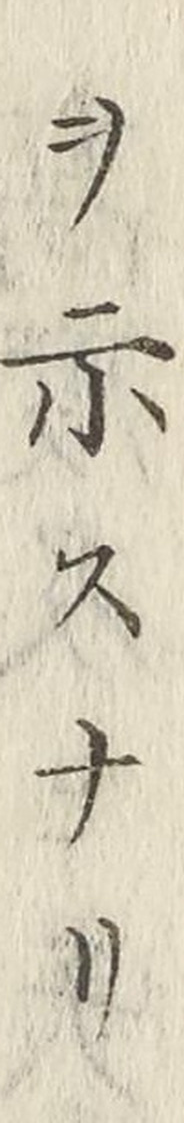ヲ示スナリ
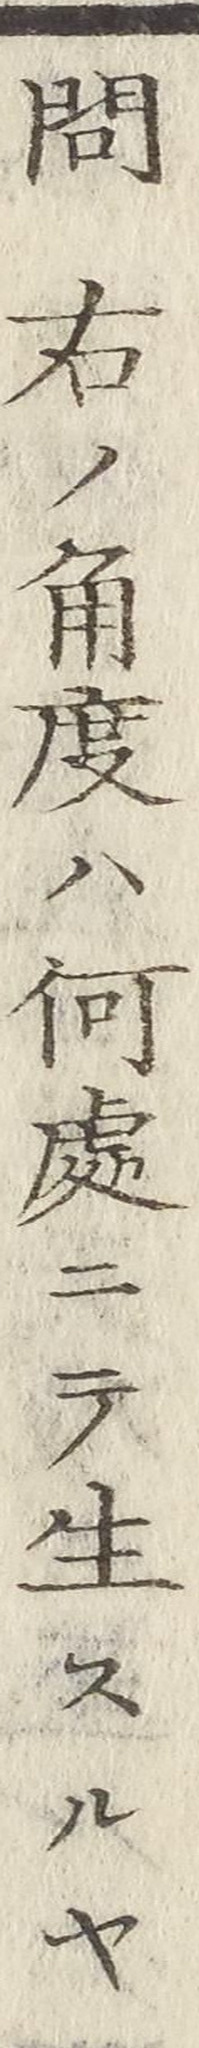問右ノ角度ハ何処ニテ生スルヤ
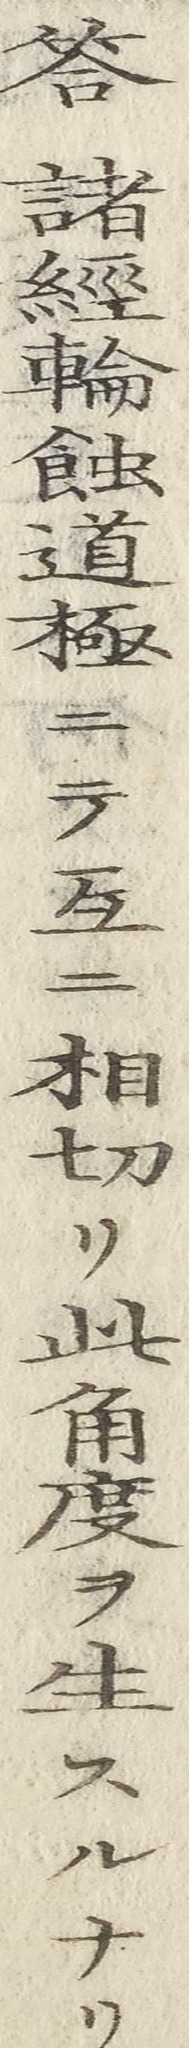答諸経輪蝕道極ニテ互ニ相切リ此角度ヲ生スルナリ
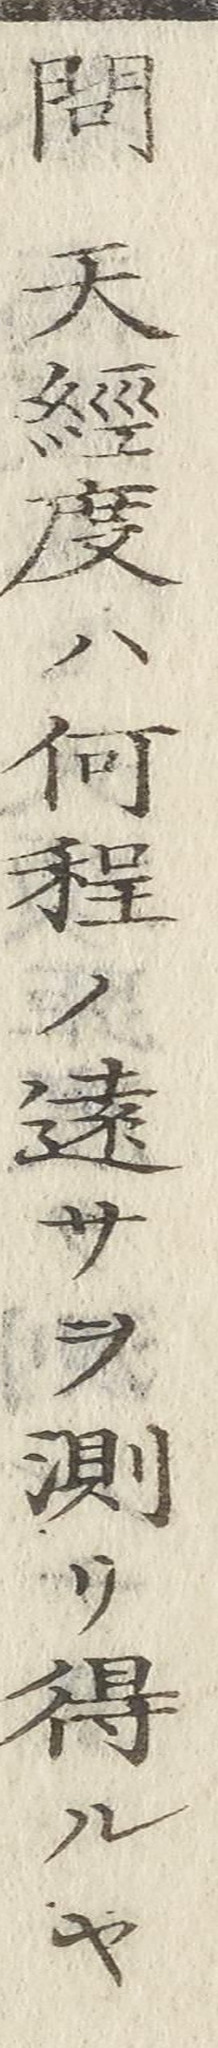問天経度ハ何程ノ遠サヲ測リ得ルヤ
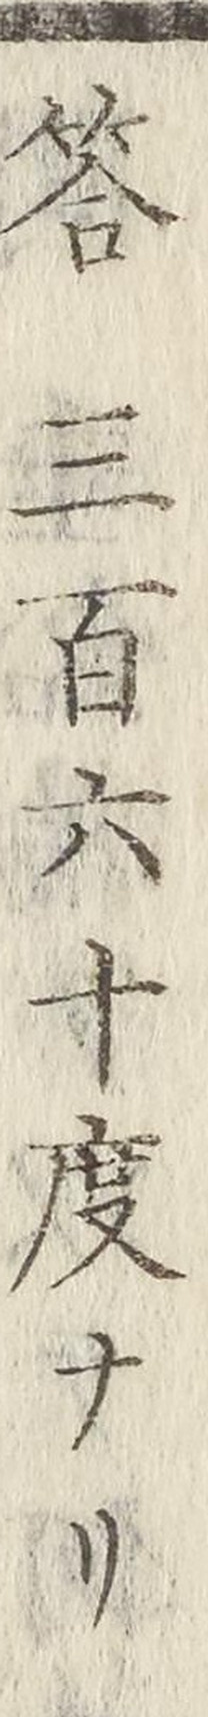答三百六十度ナリ
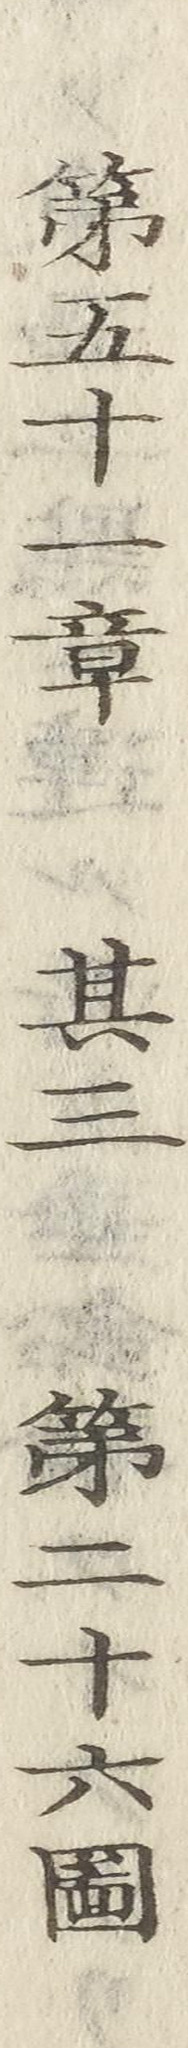第五十一章其三第二十六図
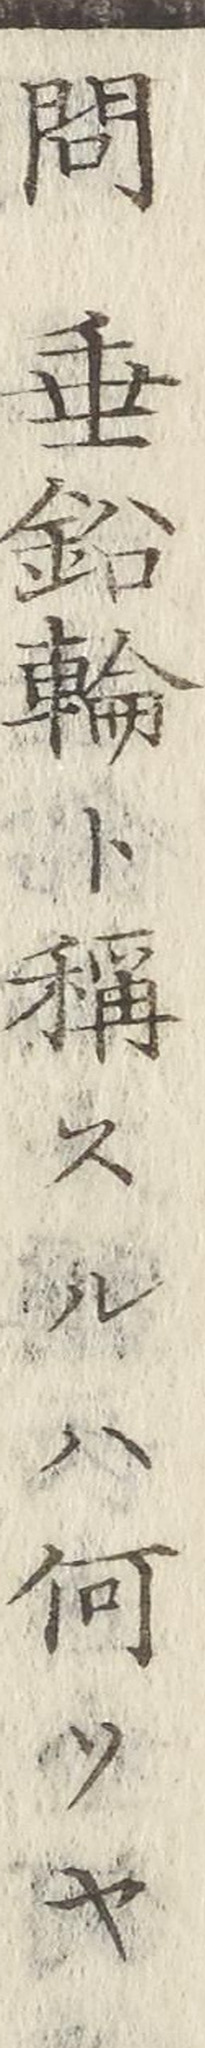問垂鉛輪ト称スルハ何ソヤ
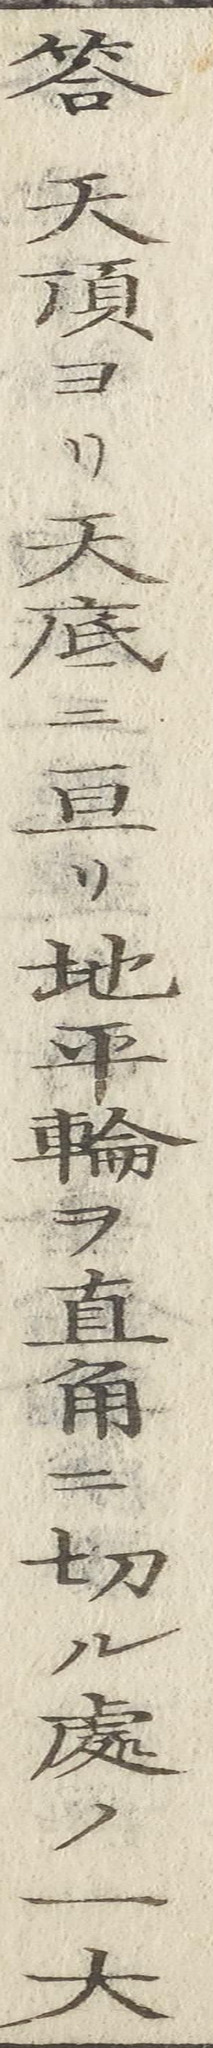答天頂ヨリ天底ニ亘リ地平輪ヲ直角ニ切ル処ノ一大
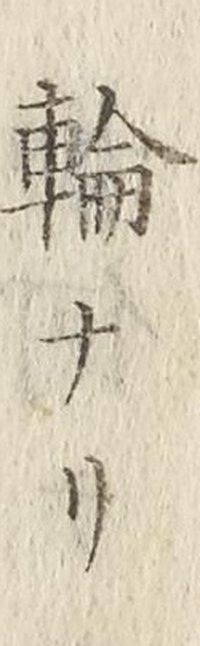輪ナリ
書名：星学圖説　下
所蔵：東京大学地震研究所図書室 Earthquake Research Institute Library, The University of Tokyo, JAPAN
